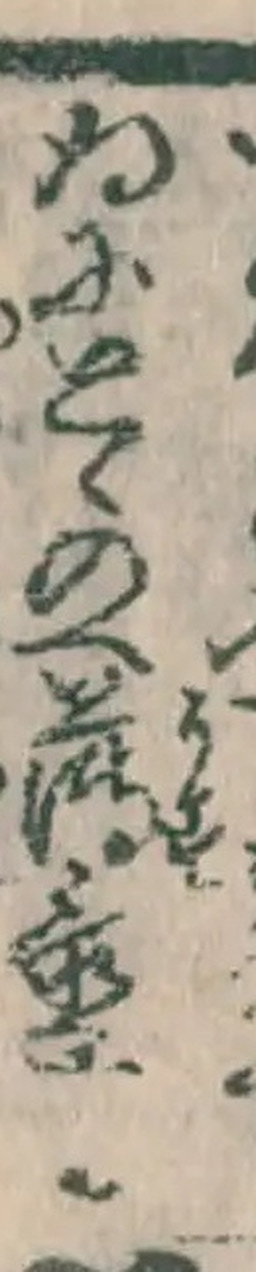ゐにとゝのへ薄置
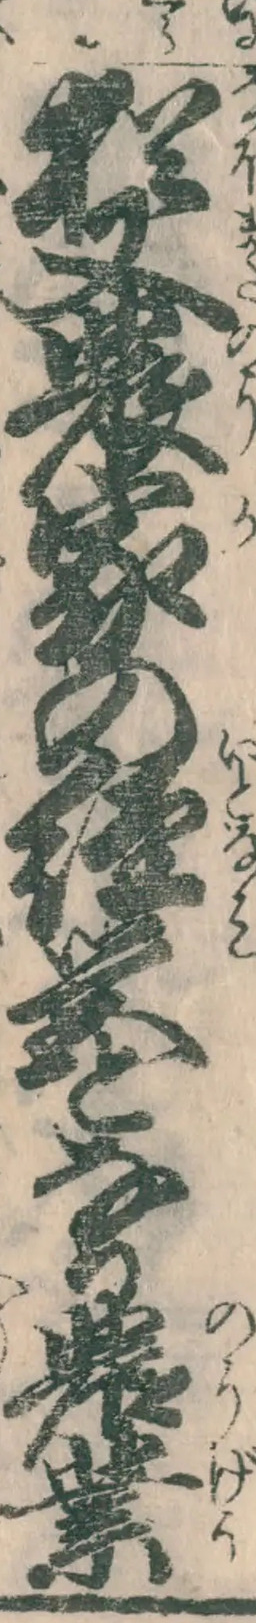猶又農家の経営となる農業
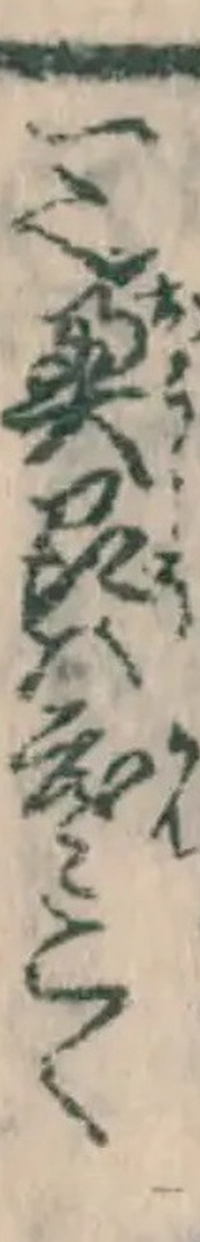一也奥州は寒こく
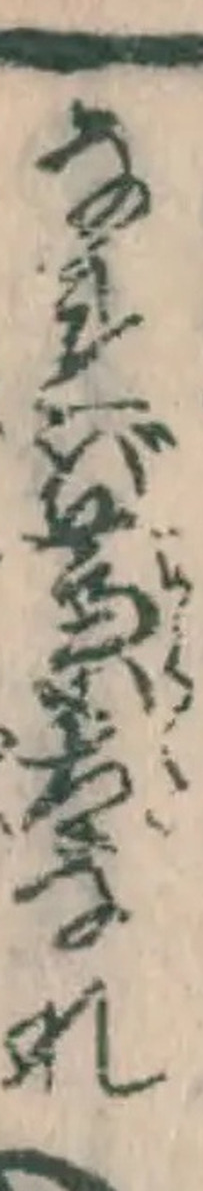なれば藁太なれ
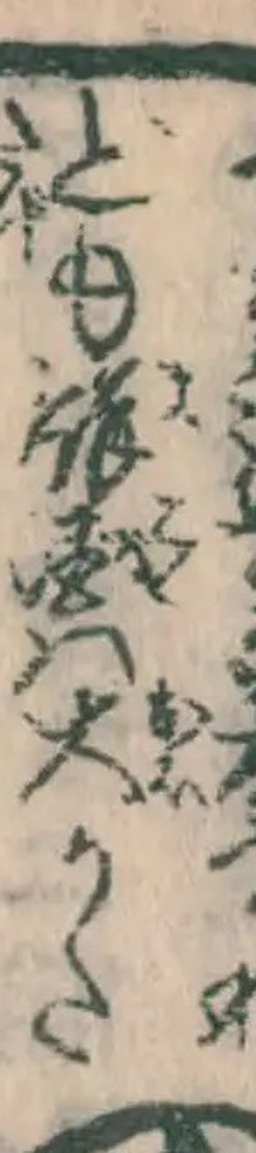ども餘国は大かた
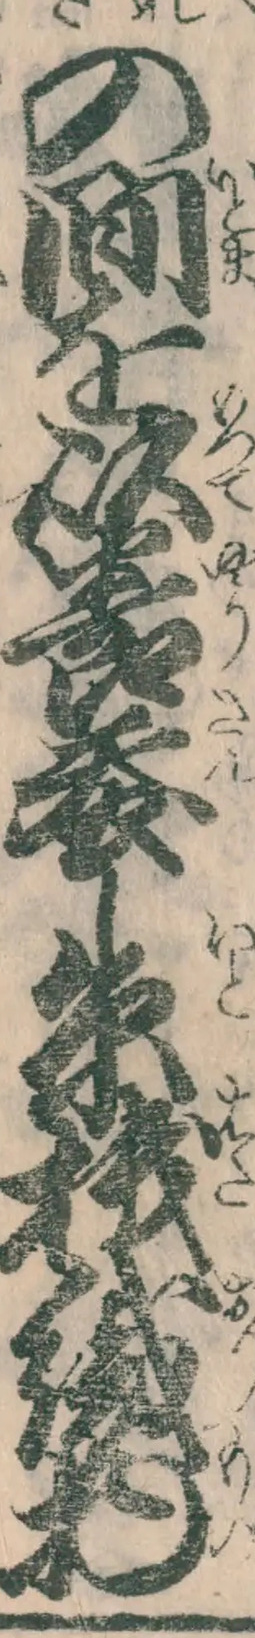の間を以養蚕し糸機織物
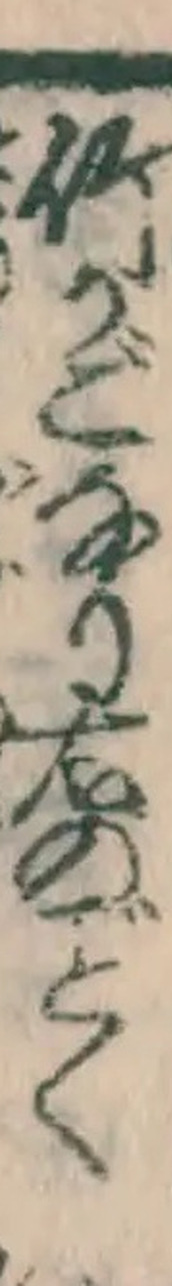竹かごなり右のごとく
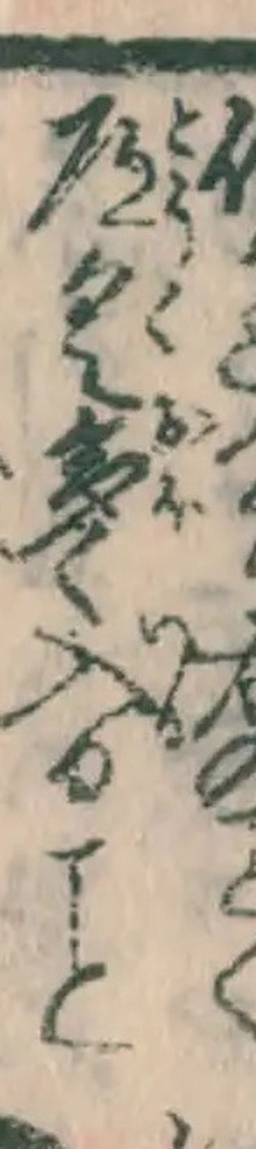道具多く入ること
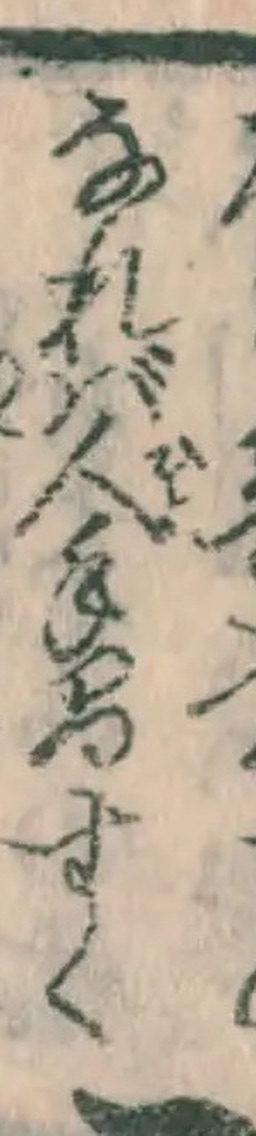なれば人手間すく
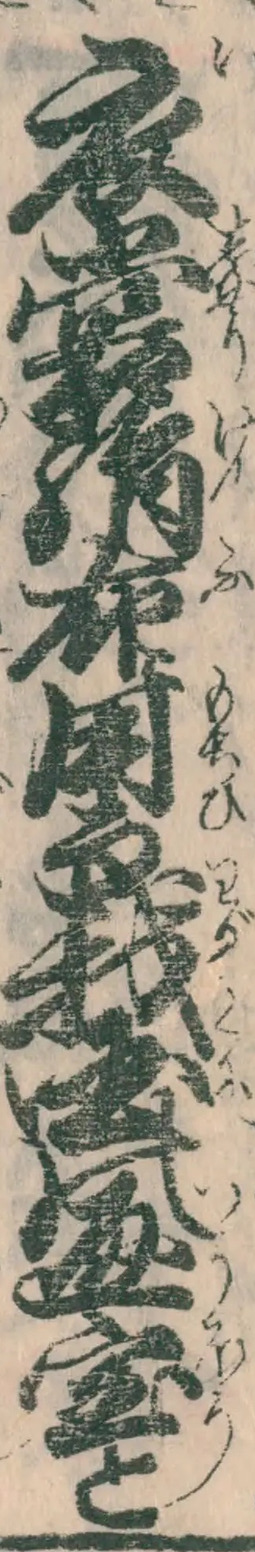衣裳絹布用て我国の通宝と
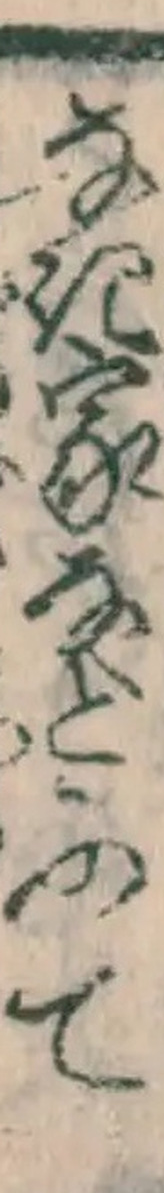なき家なとにて
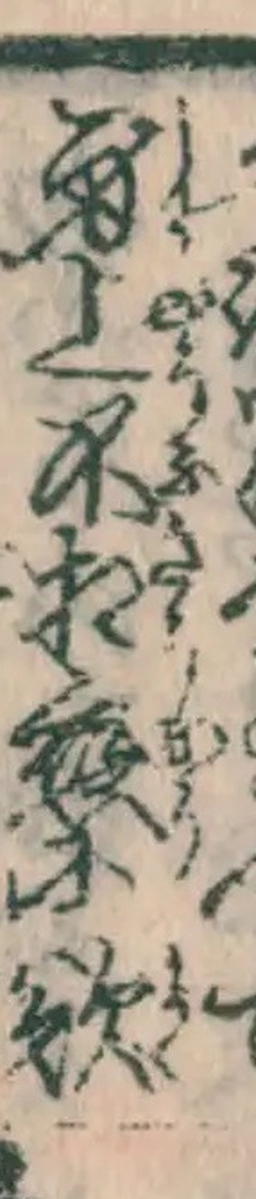身上不相応に欲
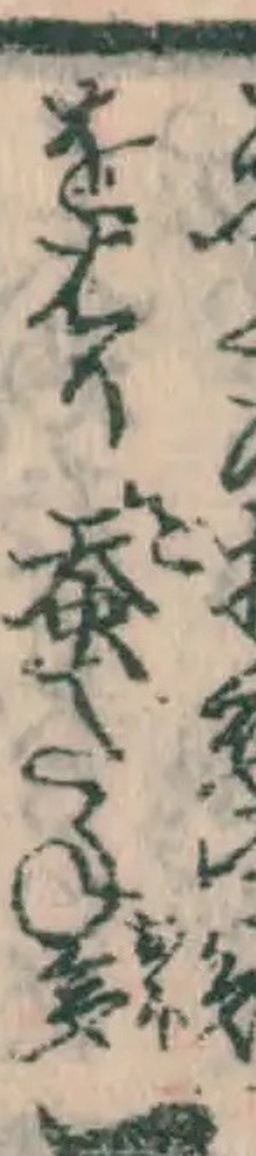をはり蚕たね多
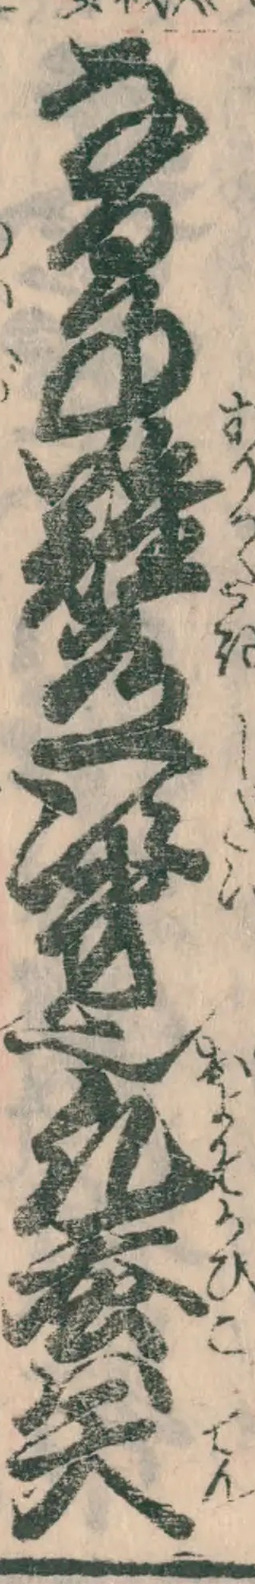なる事難有次第也凡蚕は天
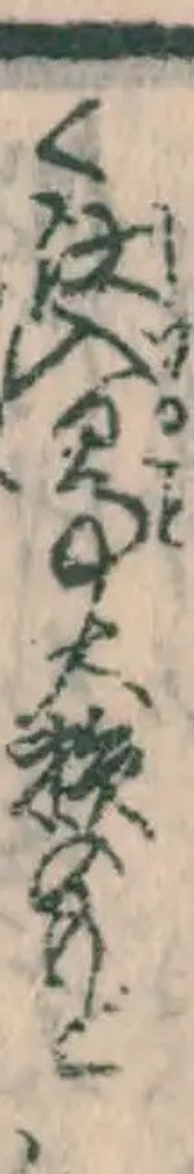く仕入る事大損のもと
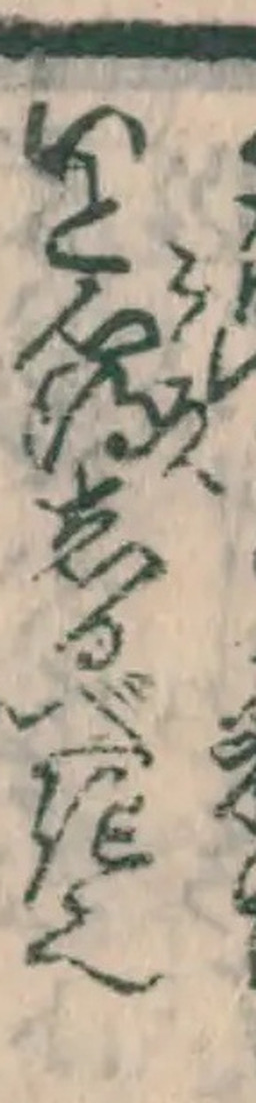いと心得知るべき也
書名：養蚕往来
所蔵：国立国会図書館 National Diet Library, JAPAN
